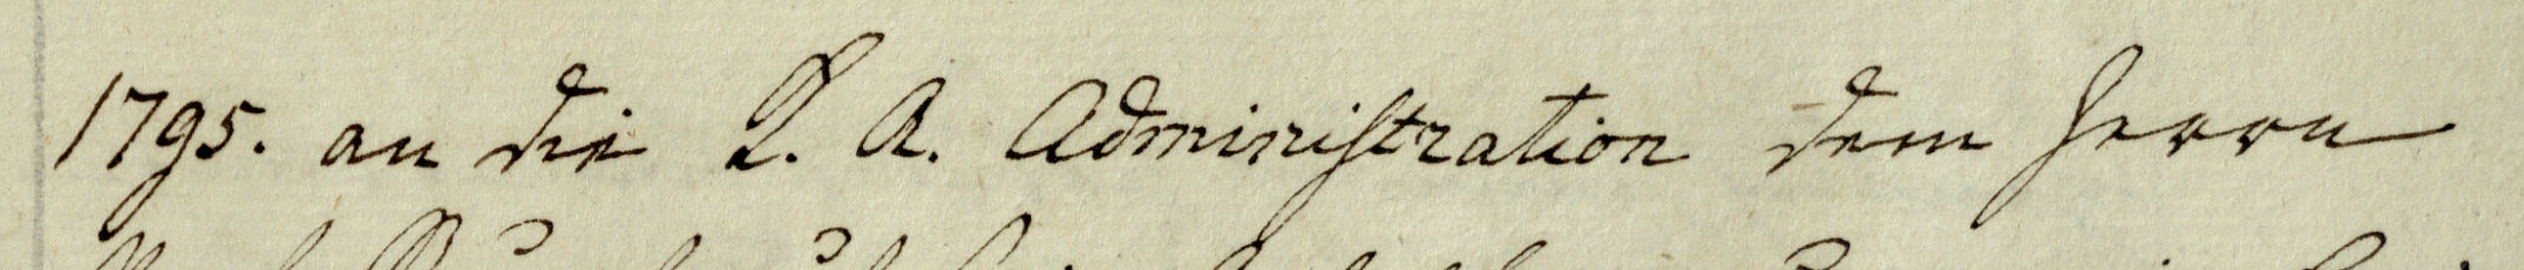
1795. an die K. A. Administration dem Herrn
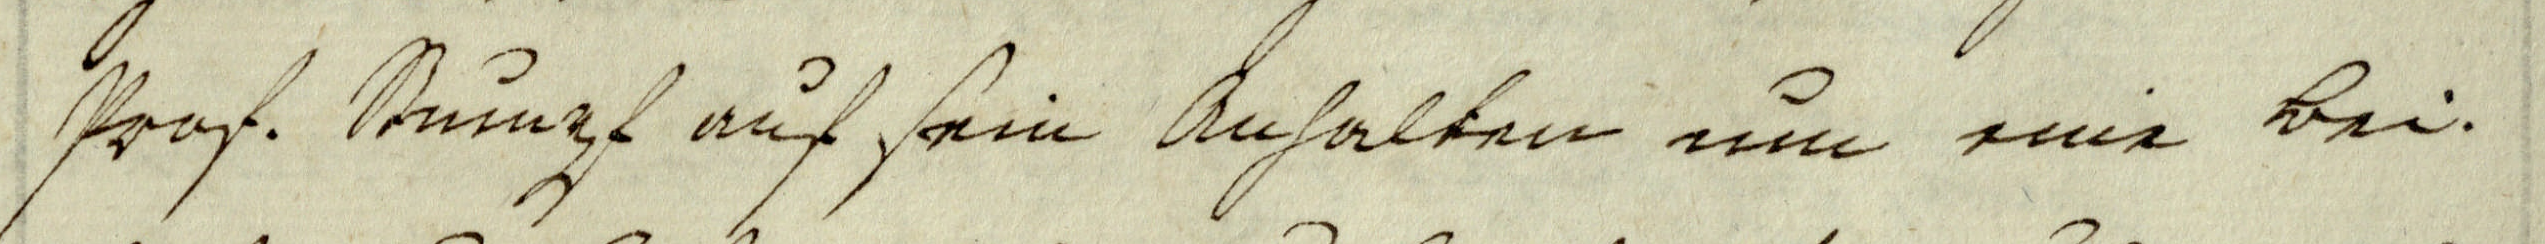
Prof. Stumpf auf sein Anhalten um eine Bei¬
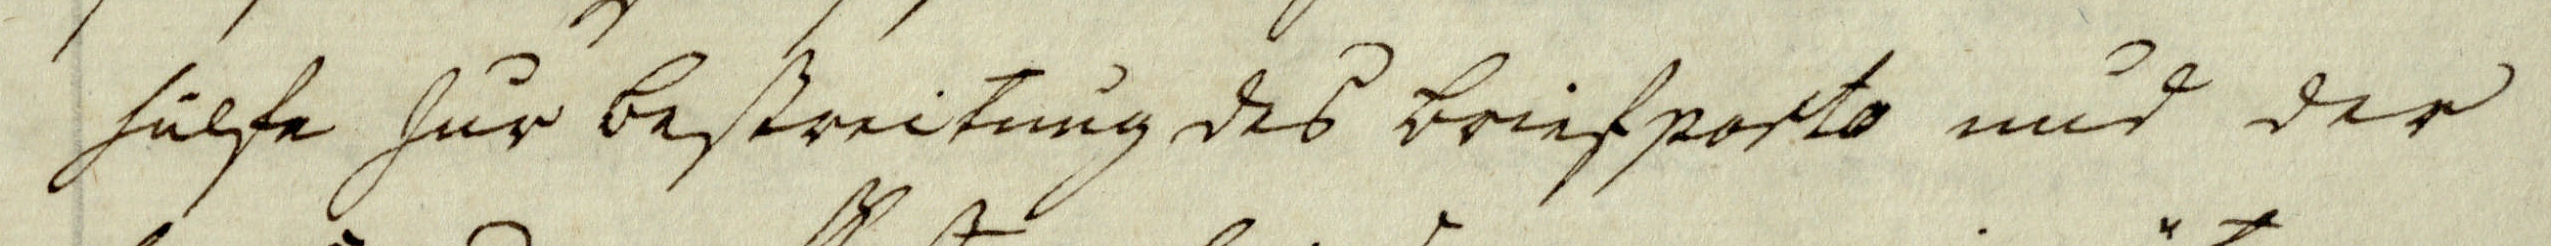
hülfe zur Bestreitung des Briefporto und der
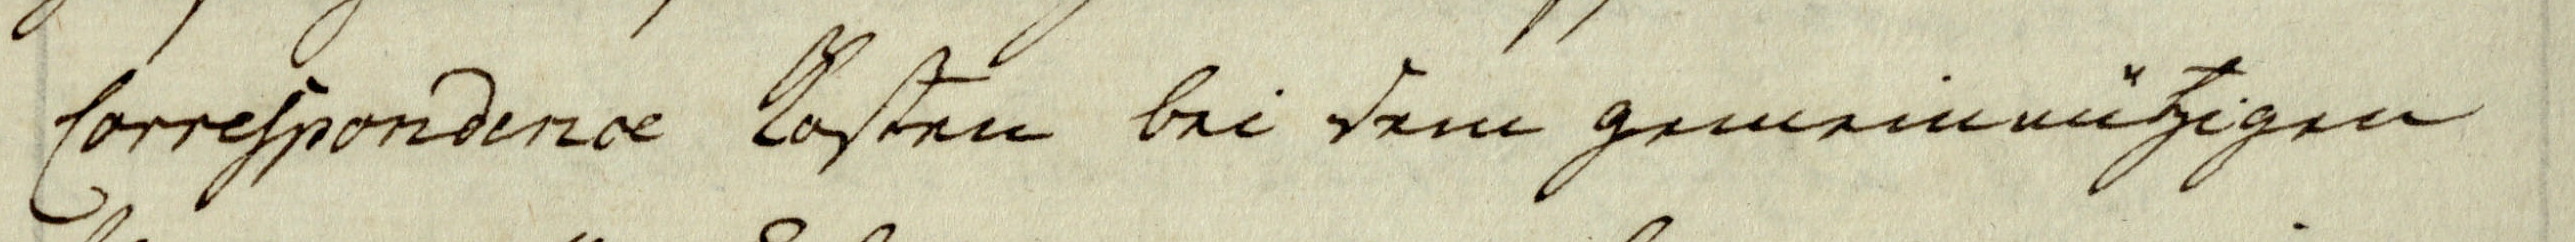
Correspondence Kosten bei dem gemeinnützigen
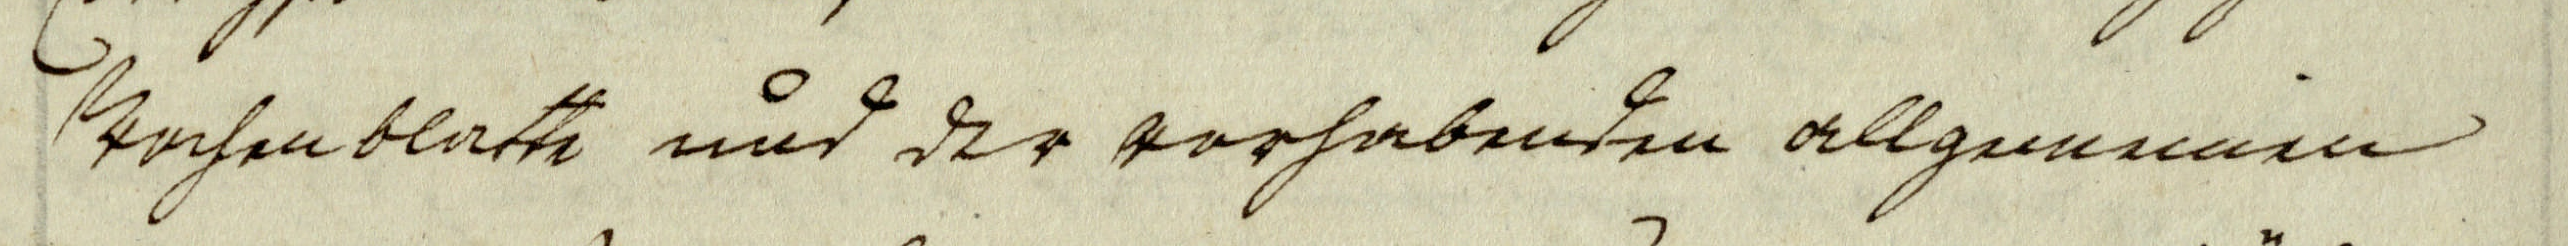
Wochenblatte und der vorhabenden allgemeinen
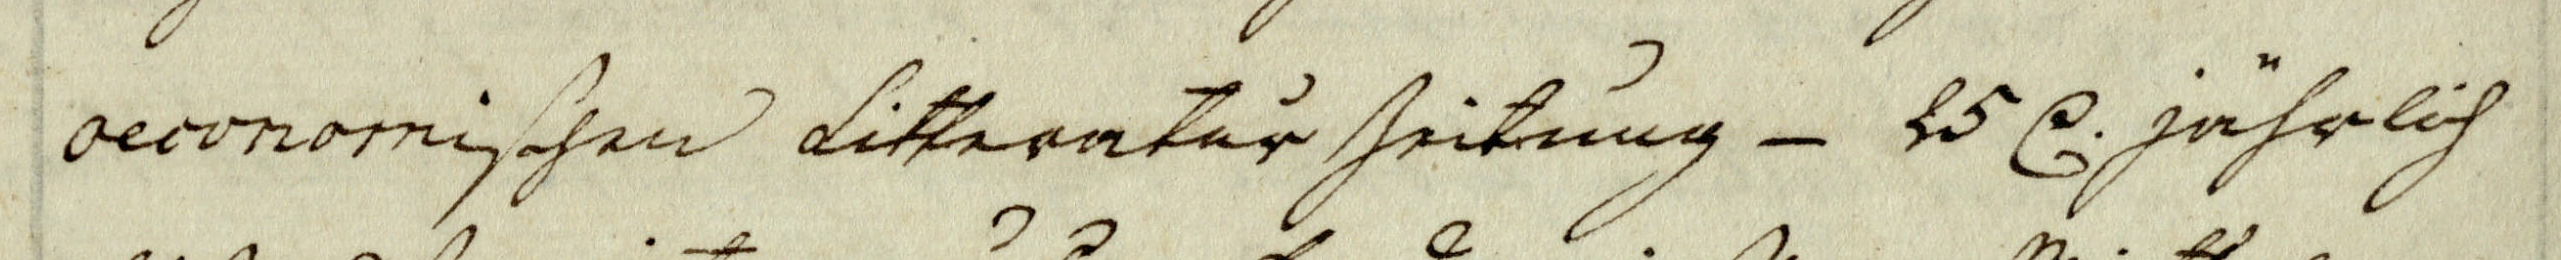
oeconomischen Litteratur Zeitung - 25 l. jährlich
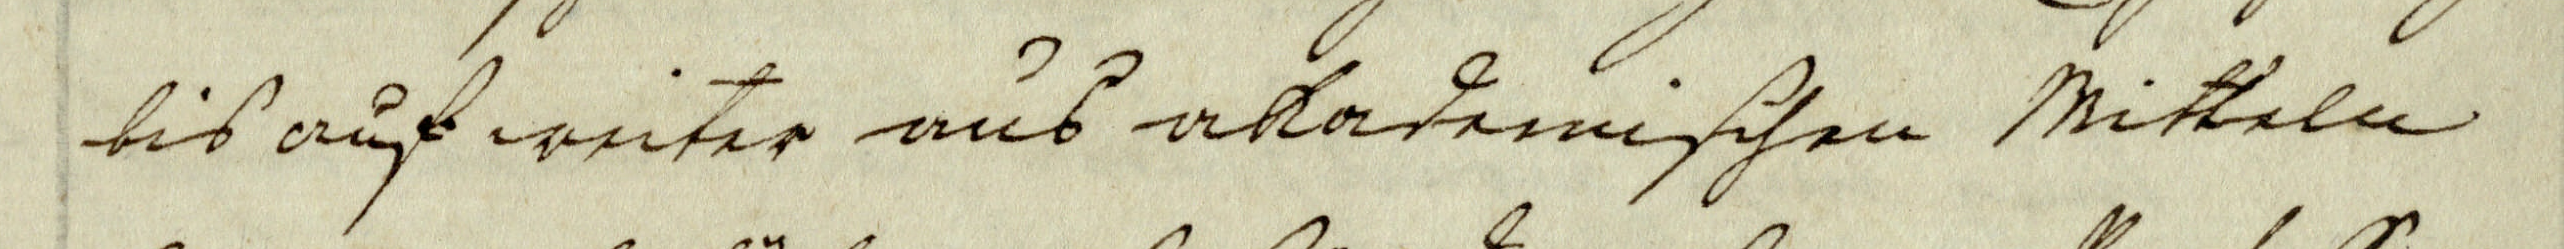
bis auf weiter aus akademischen Mitteln
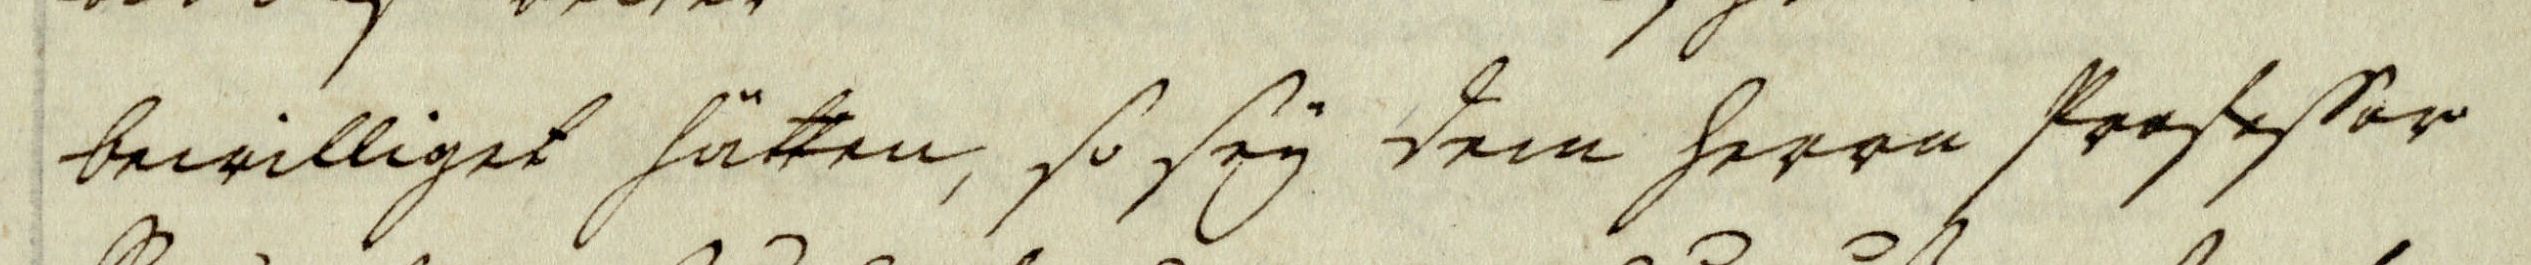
bewilliget hätten, so seÿ dem Herrn Professor
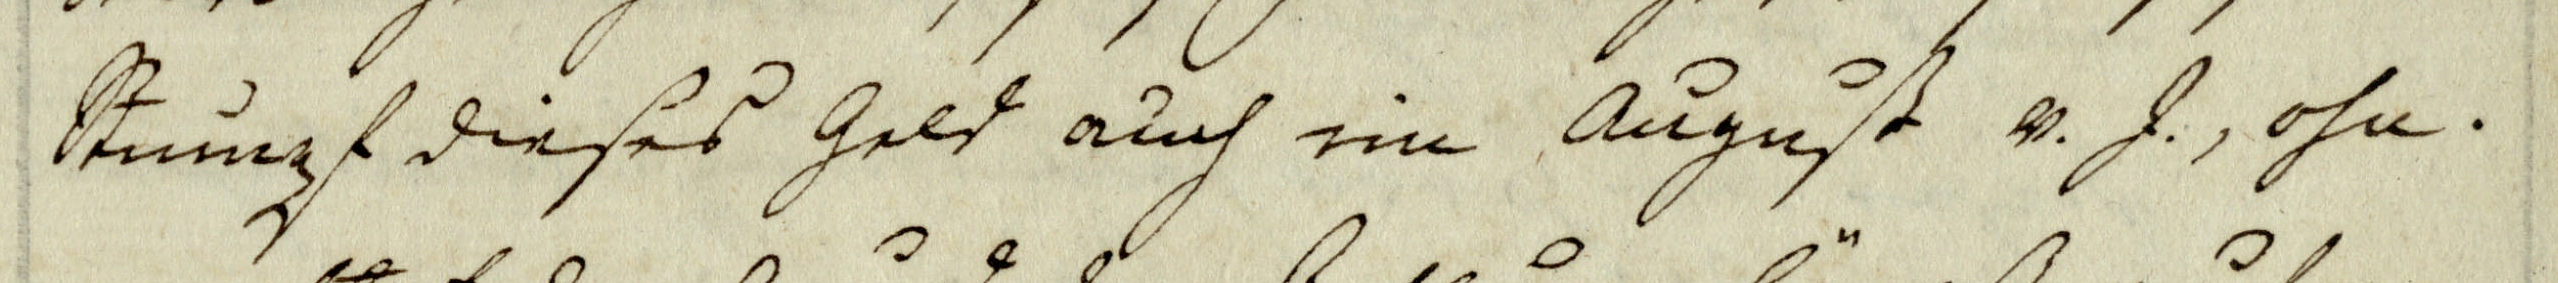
Stumpf dieses Geld auch im August v. J., ohn¬
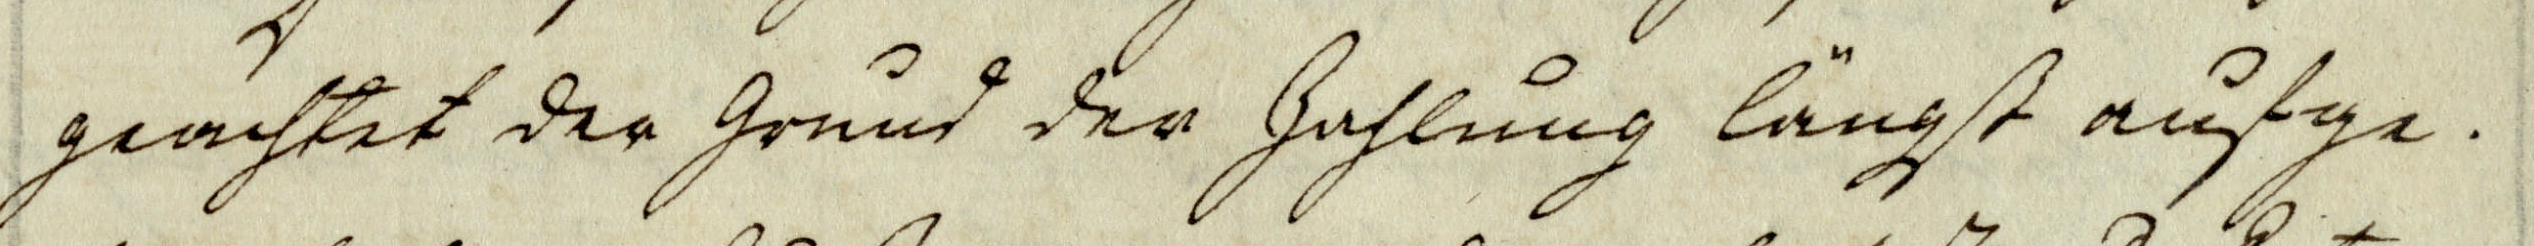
geachtet der Grund der Zahlung längst aufge¬
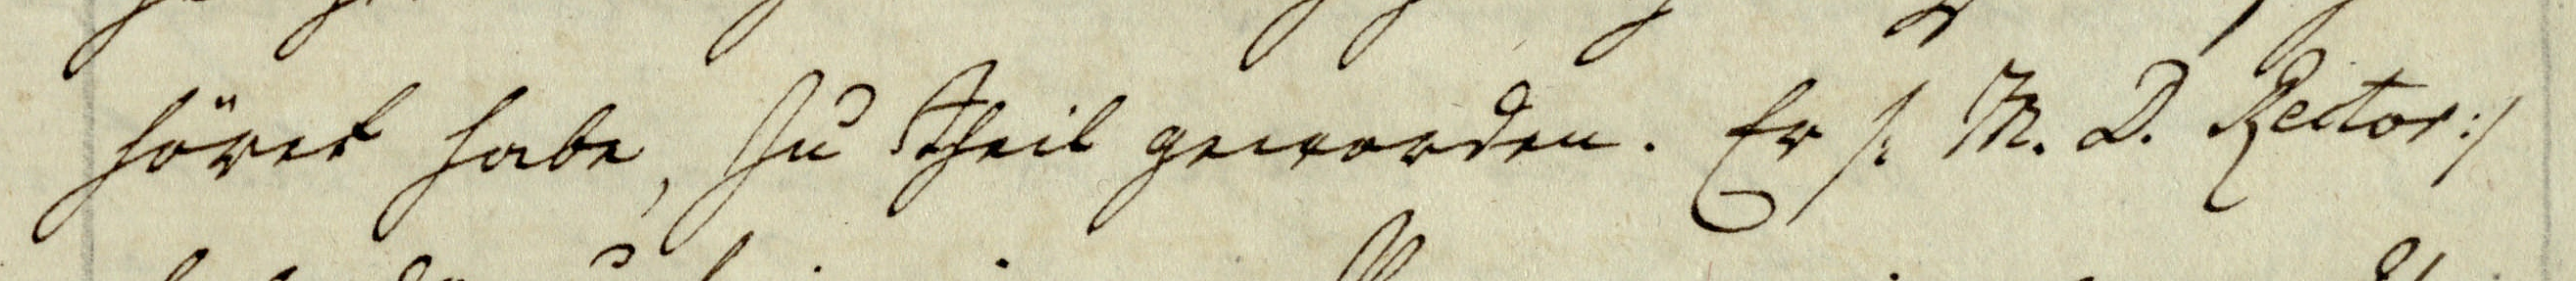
höret habe, zu Theil geworden. Er /: M. D. Rector :/
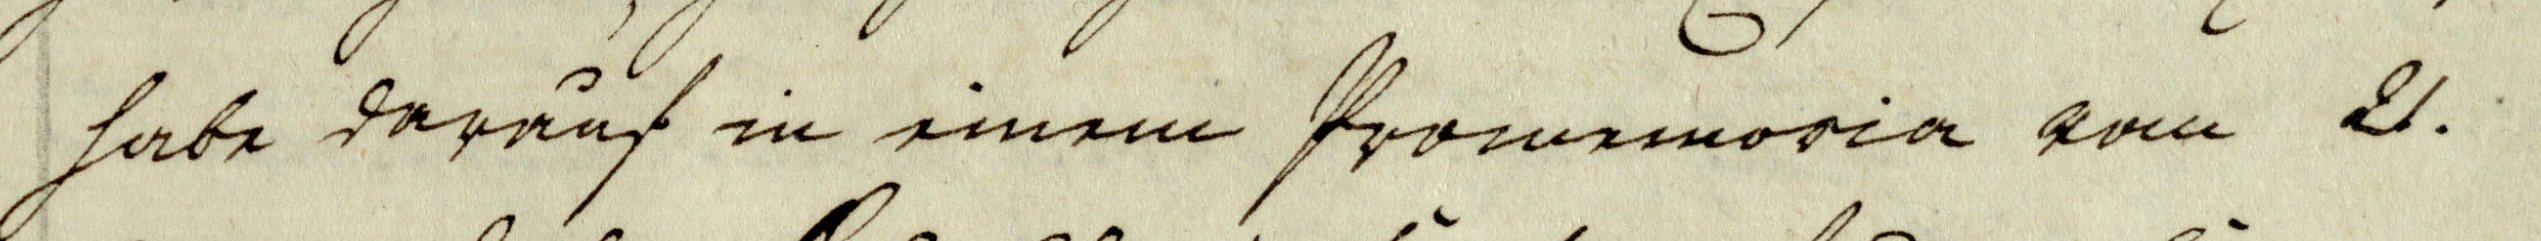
habe darauf in einem Promemoria vom 21.
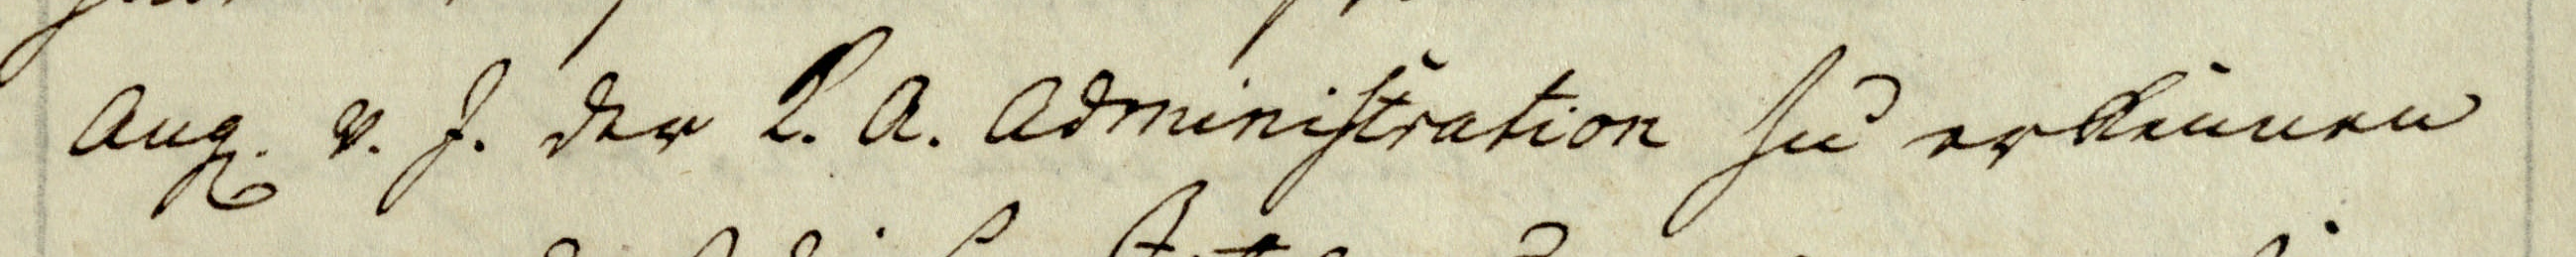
Aug. v. J. der K. A. Administration zu erkennen
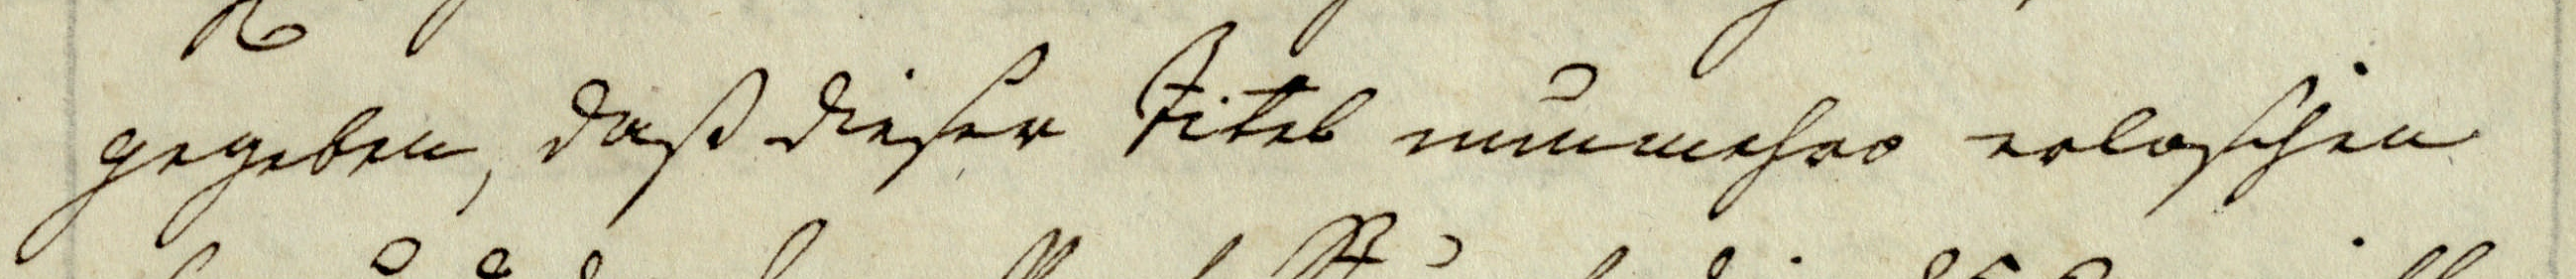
gegeben, daß dieser Titel nunmehro erloschen
